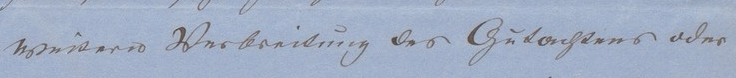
weitern Verbreitung des Gutachtens oder
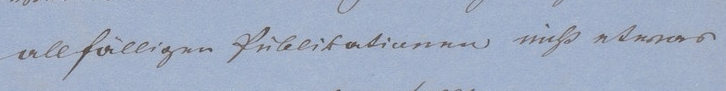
allfälligen Publikationen nicht etwas
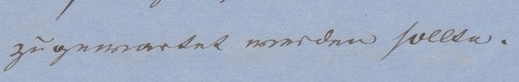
zugewartet werden sollte. –
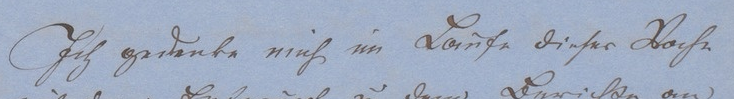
Ich gedenke mich im Laufe dieser Woche
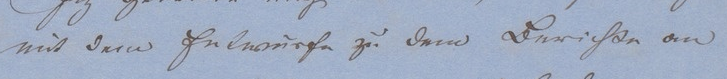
mit dem Entwurfe zu dem Berichte an
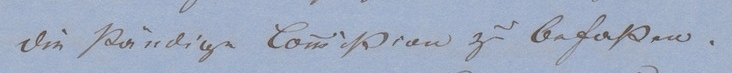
die ständige Commißion zu befaßen.
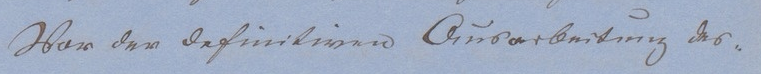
Vor der definitiven Ausarbeitung des-
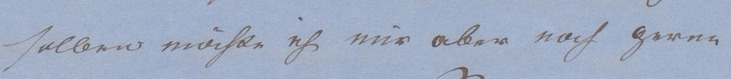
selben möchte ich mir aber noch gerne
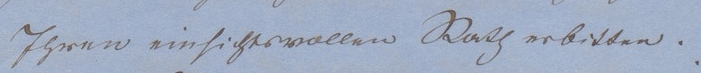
Ihren einsichtsvollen Rath erbitten.
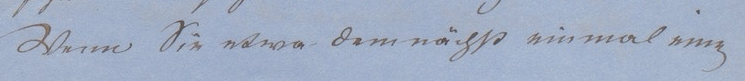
Wenn Sie etwa demnächst einem einmal eine
